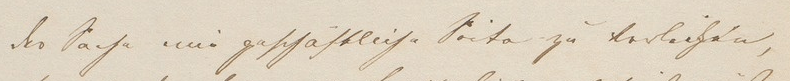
der Sache eine geschäftliche Seite zu verleihen,
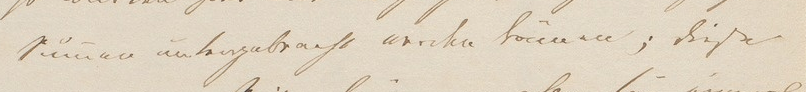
Summen untergebracht werden können; diese
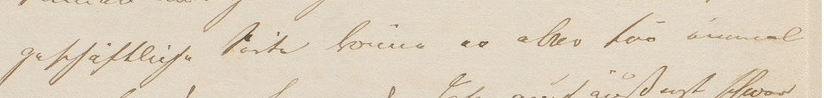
geschäftliche Seite könne er aber für einmal
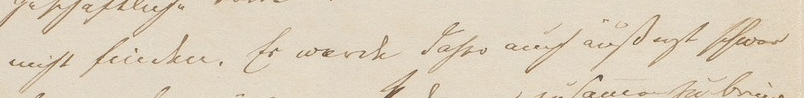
nicht finden. Es werde daher auch äußerst schwer
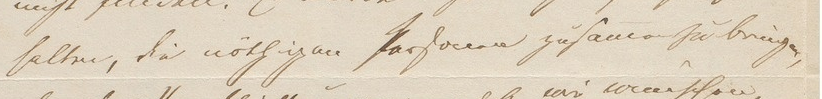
fallen, die nöthigen Personen zusammenzubringen,
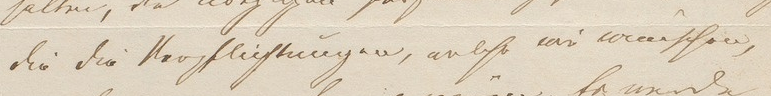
die die Verpflichtungen, welche wir wünschen,
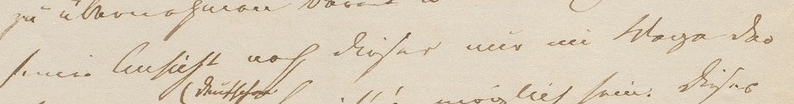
seiner Ansicht nach dieser nur im Wege der
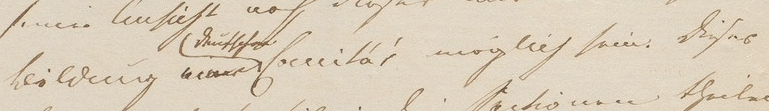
Bildung eines deutschen Comité's möglich sein. Dieses
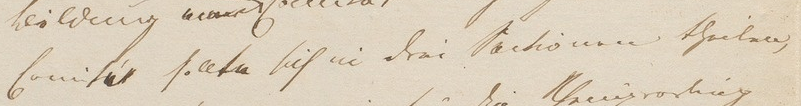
Comité sollte sich in drei Sectionen theilen,
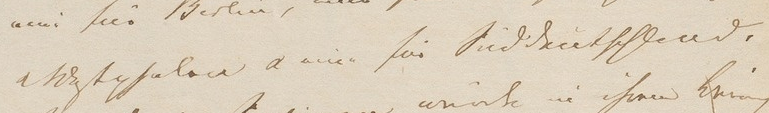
& Westphalen & eine für Süddeutschland.
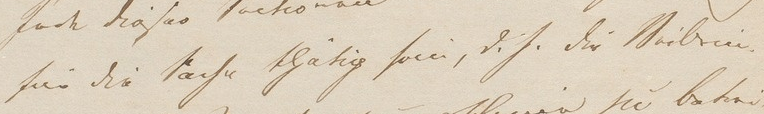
für die Sache thätig sein, d. h. die Beibrin-
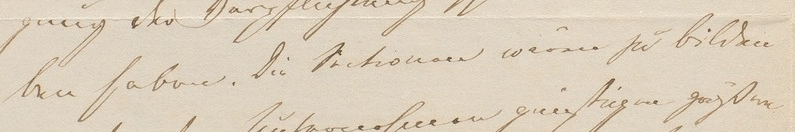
ken haben. Die Sectionen wären zu bilden
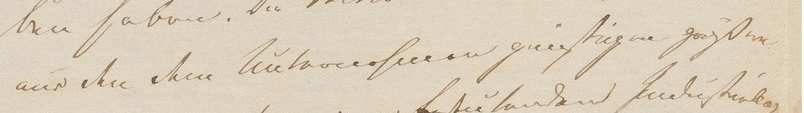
aus den dem Unternehmen günstigen größern
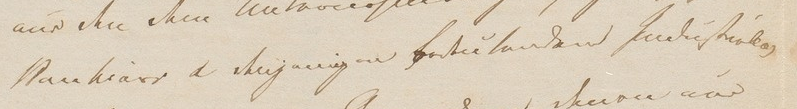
Bankiers & denjenigen bedeutenden Industriellen
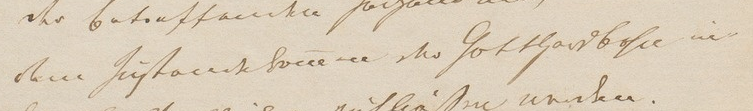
dem Zustandekommen der Gotthardbahn in-
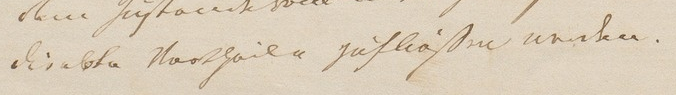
direkte Vortheile zufließen werden.
